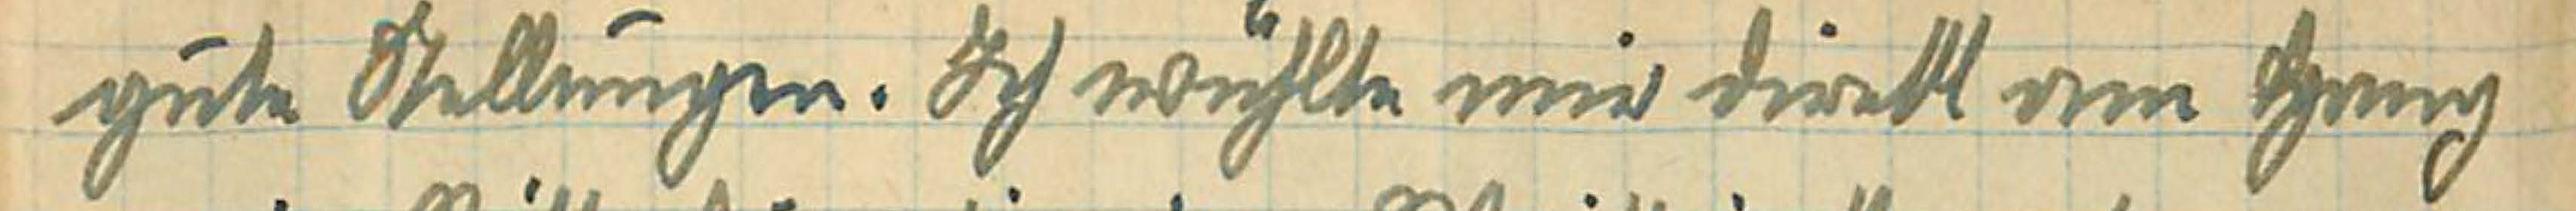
gute Stellungen. Ich wühlte mir direkt am Hang
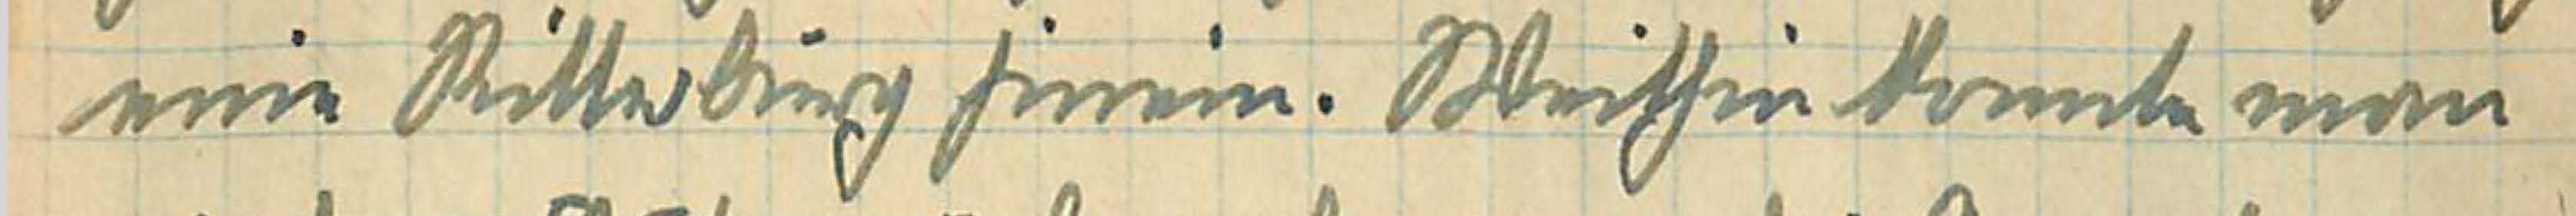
eine Ritterburg hinein. Weithin konnte man
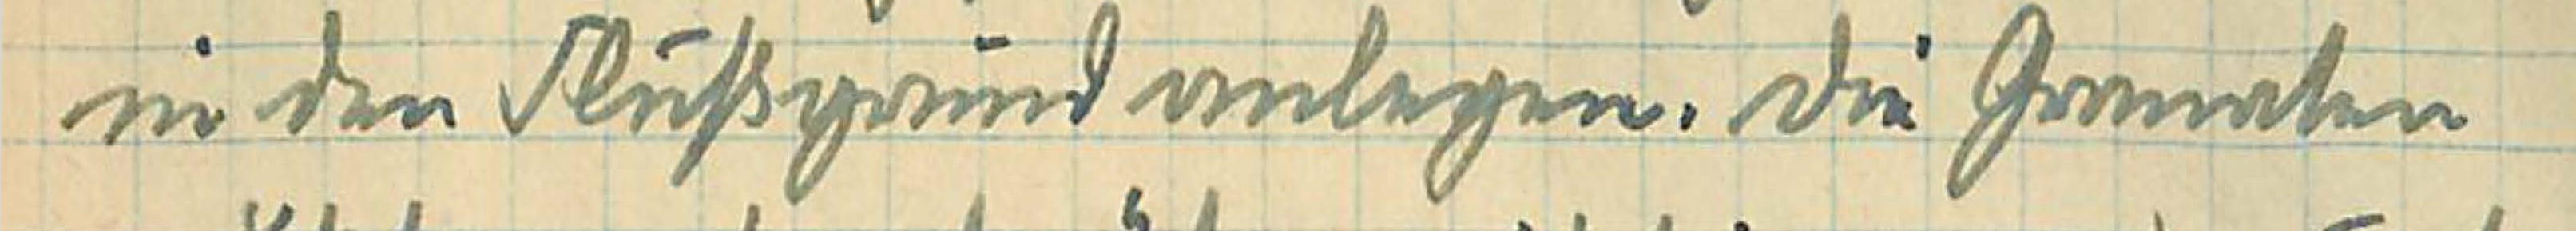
in den Flußgrund anlegen. Die Granaten
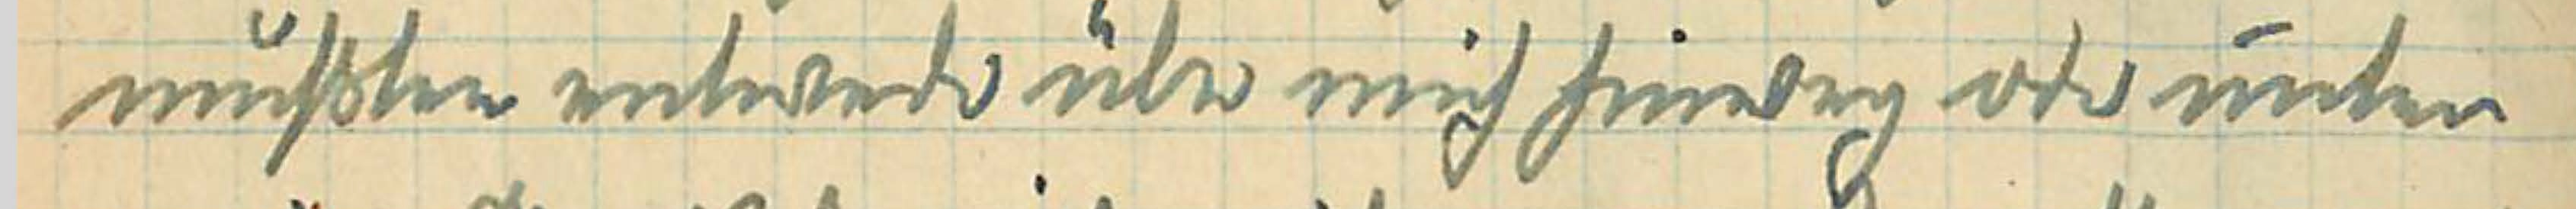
mußten entweder über mich hinweg oder unten
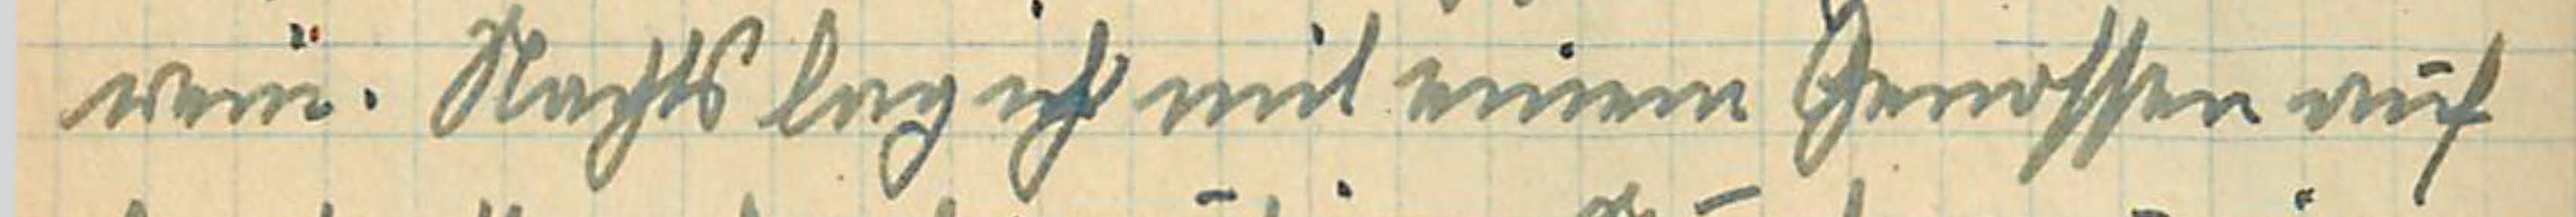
rein. Nachts lag ich mit einem Genossen auf
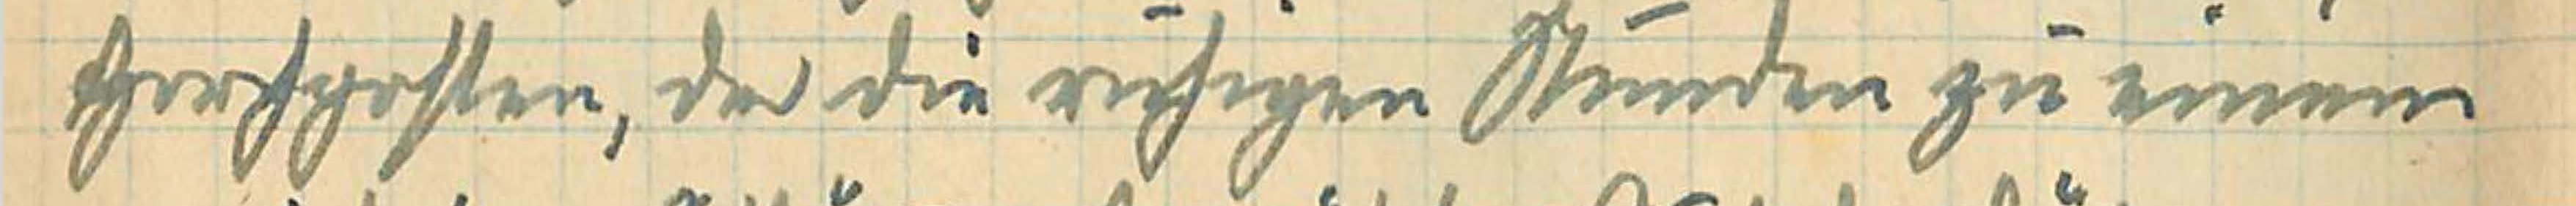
Horchposten, der die ruhigen Stunden zu einem
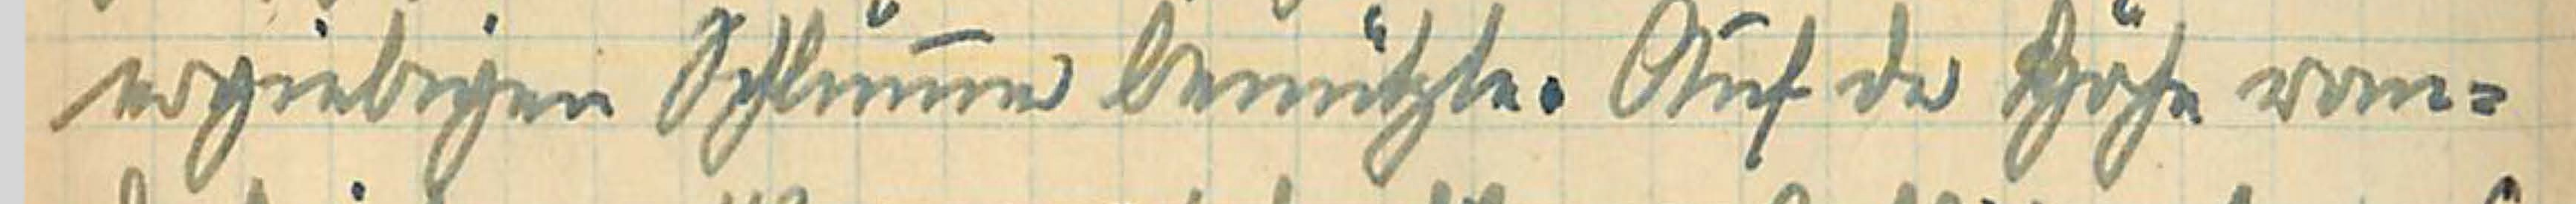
ergiebigen Schlummer benützte. Auf der Höhe ran-
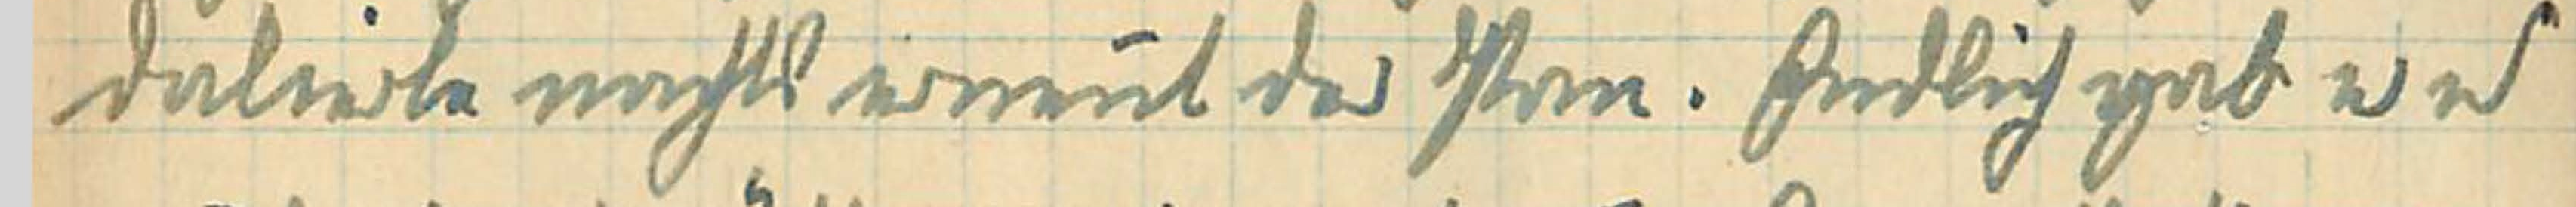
dalierte nachts erneut der Pan. Endlich gab er es
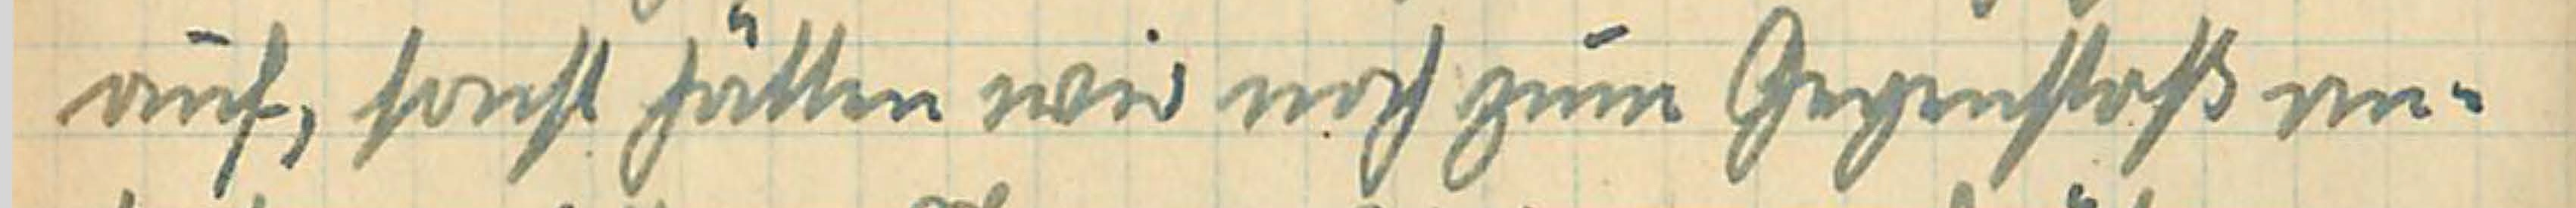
auf, sonst hätten wir noch zum Gegenstoß an-
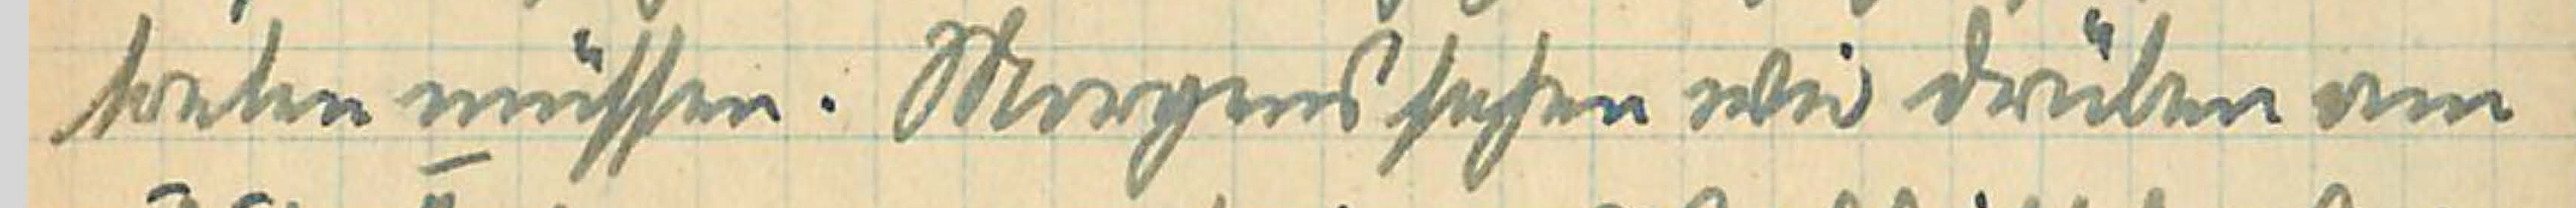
treten müssen. Morgens sehen wir drüben am
